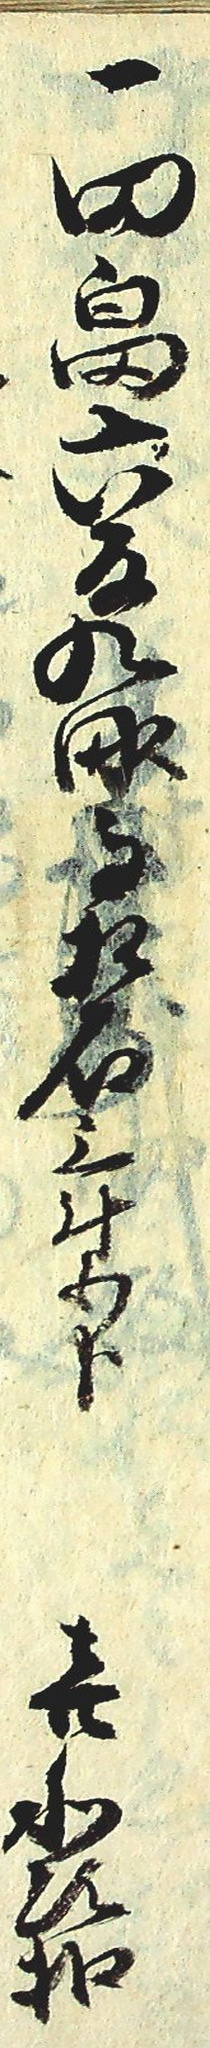一田畠六反九畝高拾石三斗五升喜和次扣
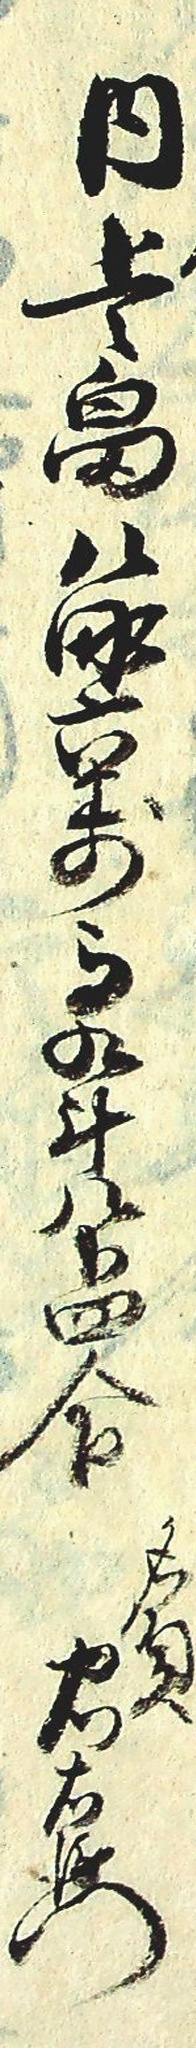内上々畠八畝六歩高九斗八升四合忠右衛門
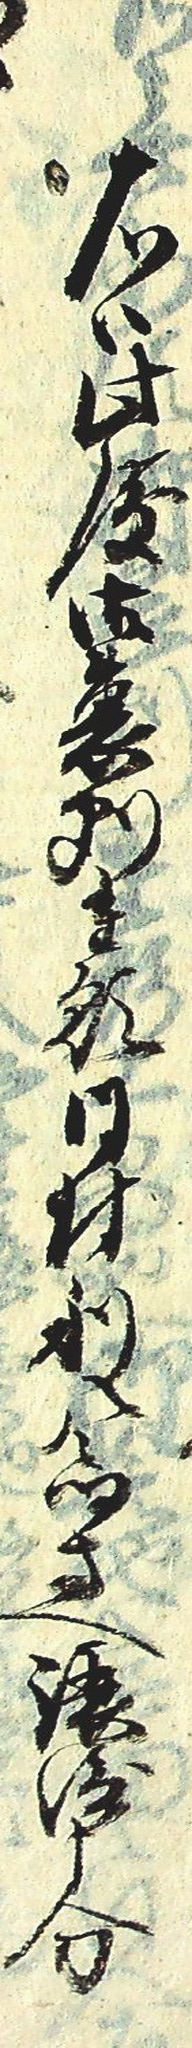右は此度御裏判奉願同村利八郎方へ譲渡申分
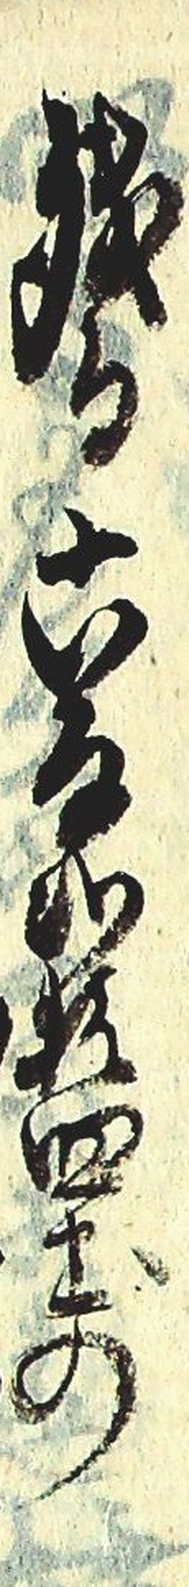残て六反弐拾四歩
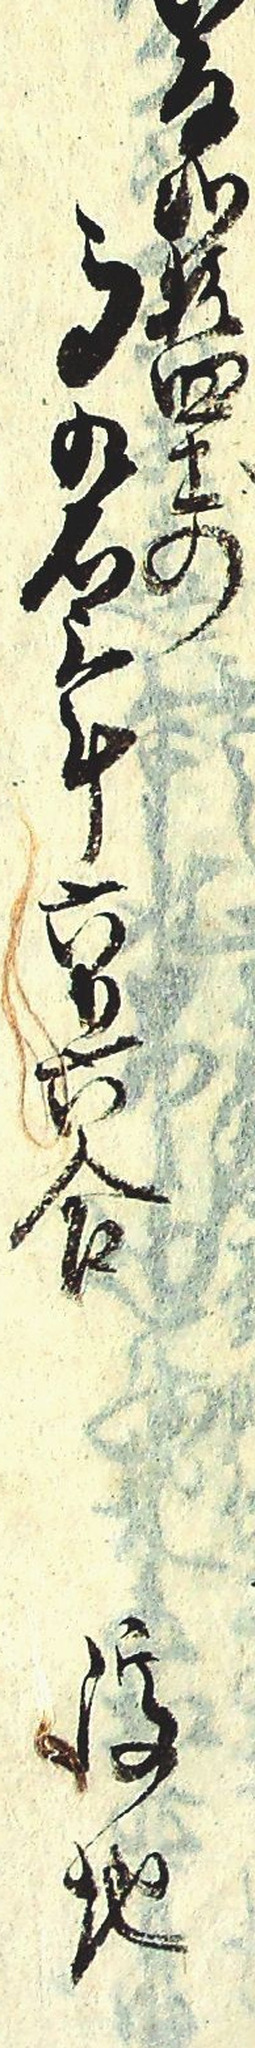高九石三斗六升六合浮地

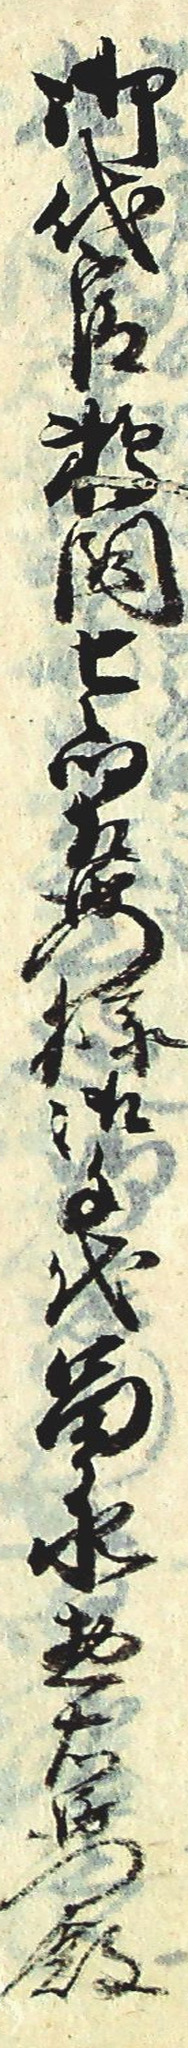御代官鵜飼七郎左衛門様御手代富永惣右衛門殿
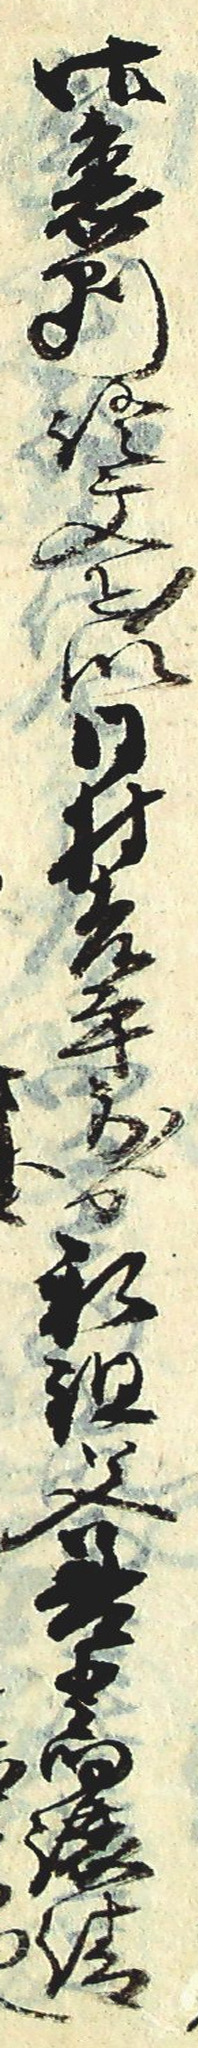御裏判証文を以同村吉平方ゟ私祖父善五郎譲請
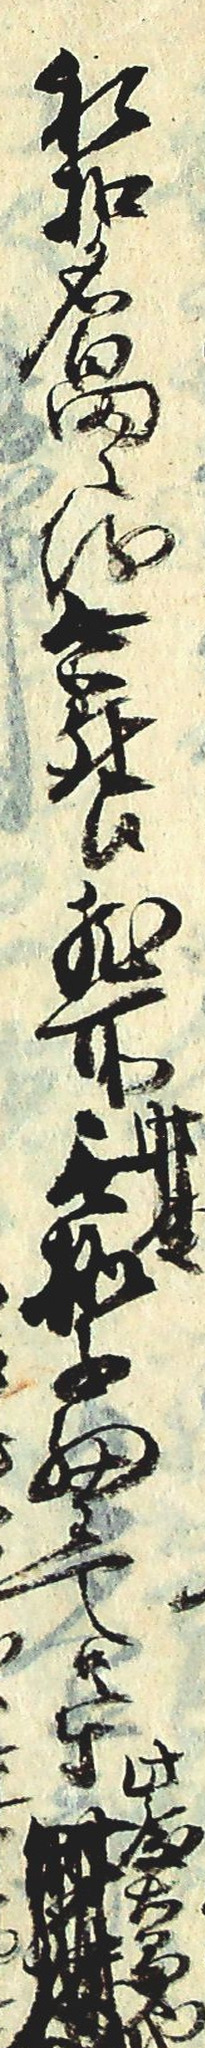私扣名畠に紛無御座候然所無拠子細有之候に付此度右畠地
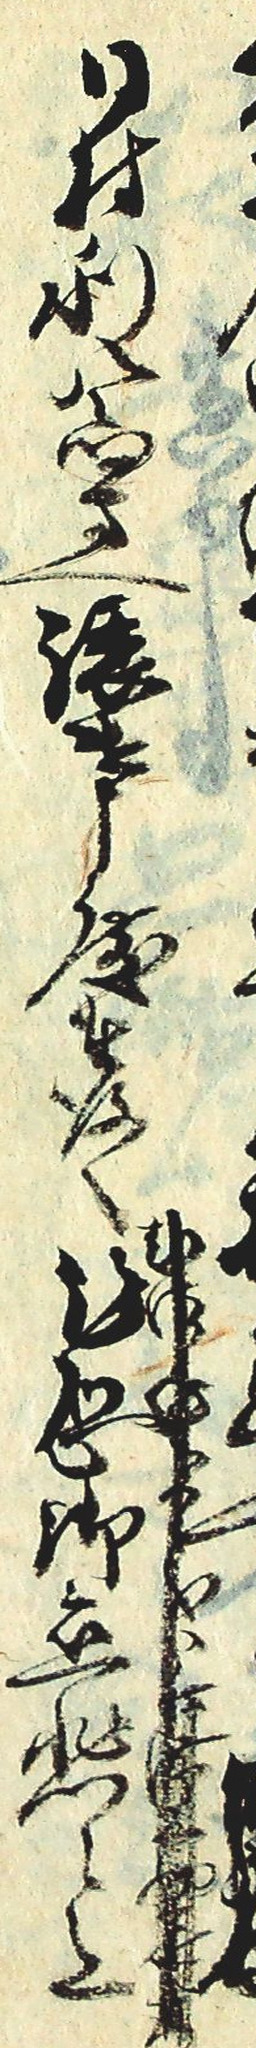同村利八郎方へ譲遣申度奉存候乍恐御慈悲之上
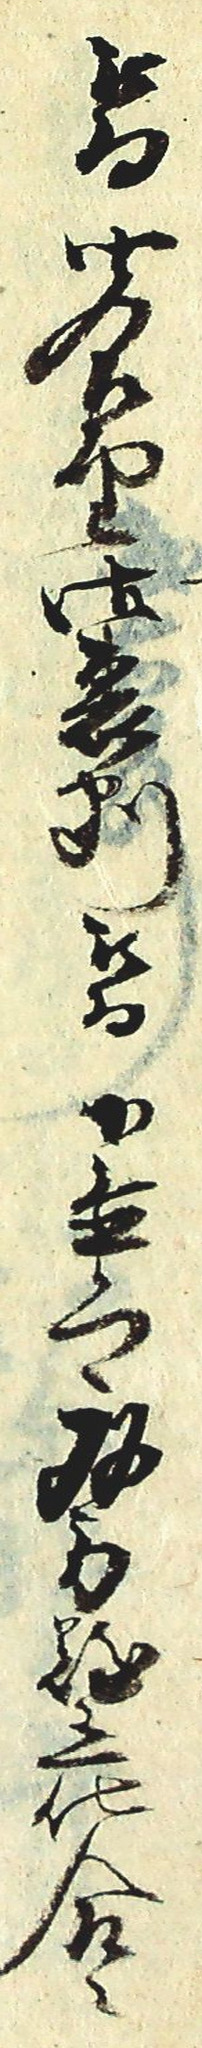被為聞召届御裏判被為下置候はゝ双方難有仕合に
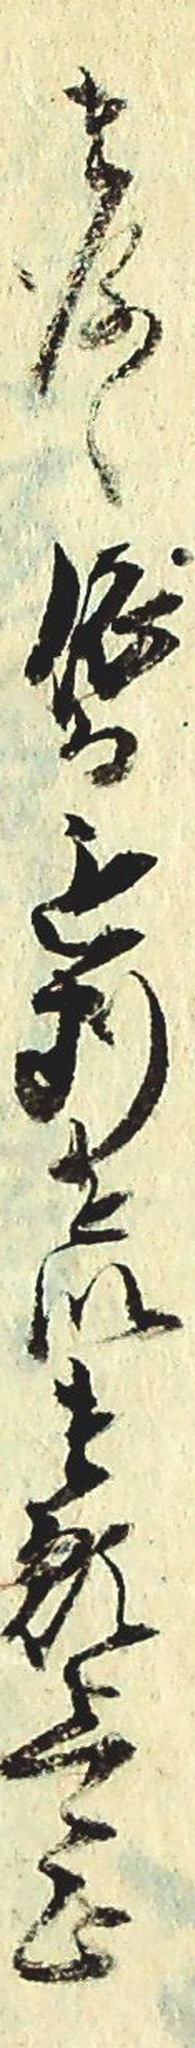奉存候依て連判を以奉願上候以上
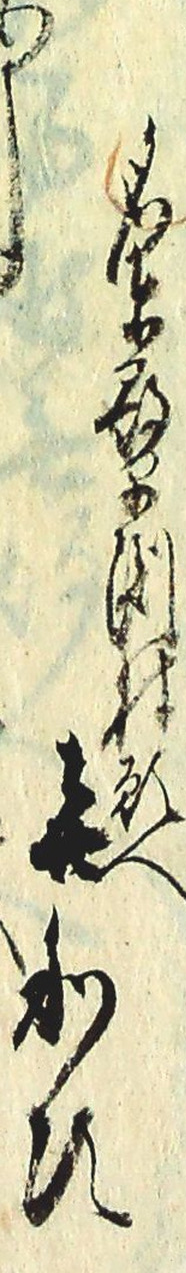名東郡早淵村願人
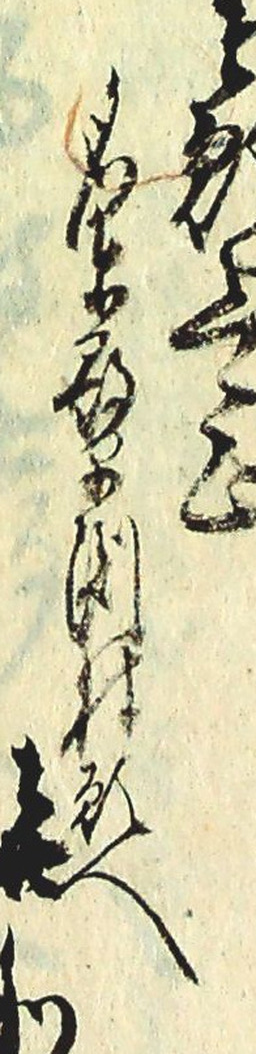名東郡早淵村願人
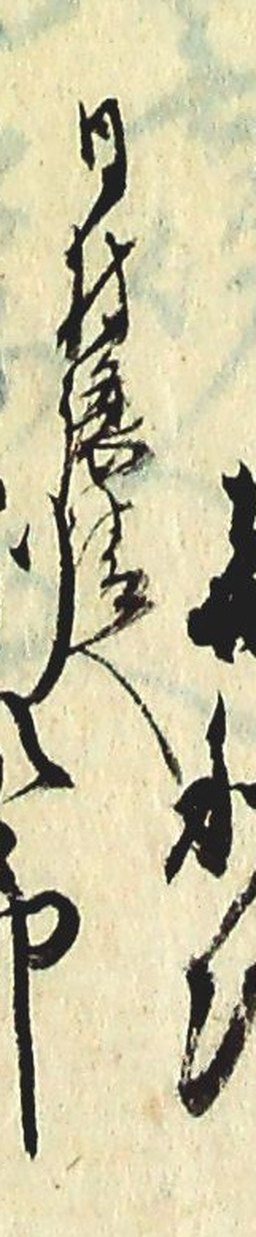同村譲請人
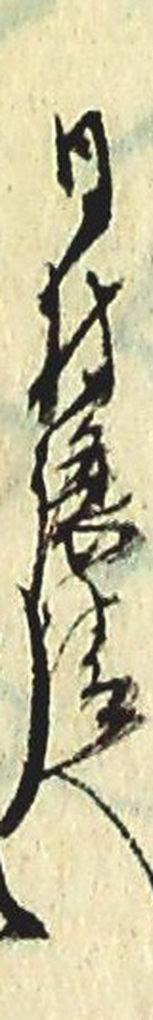同村譲請人
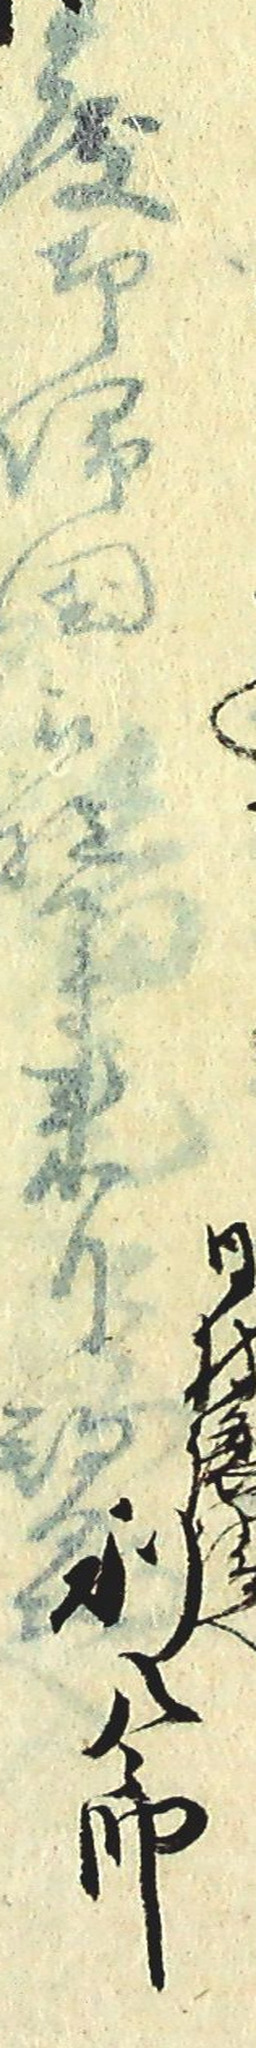利八郎
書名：諸御願書控(弐番）
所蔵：鳴門教育大学 Naruto University of Education
